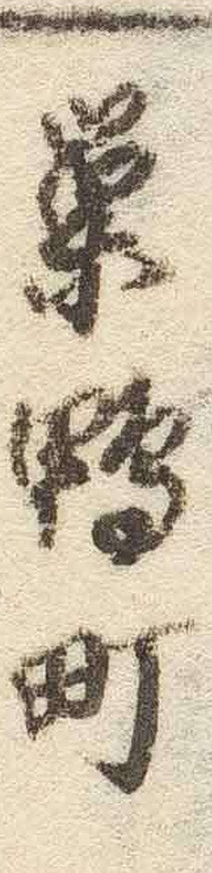巣鴨町
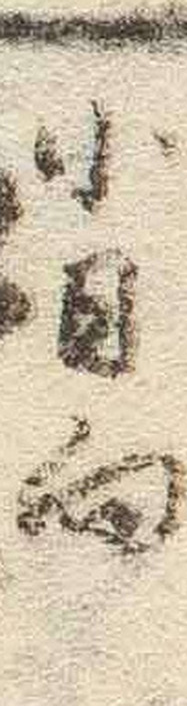小日向
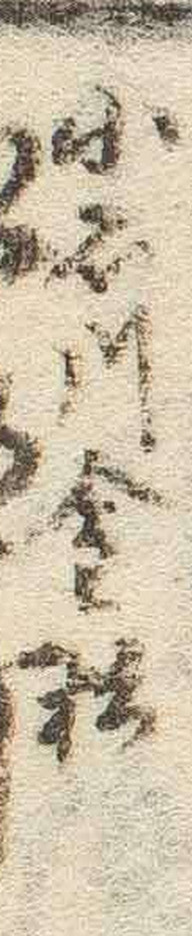小石川金杉
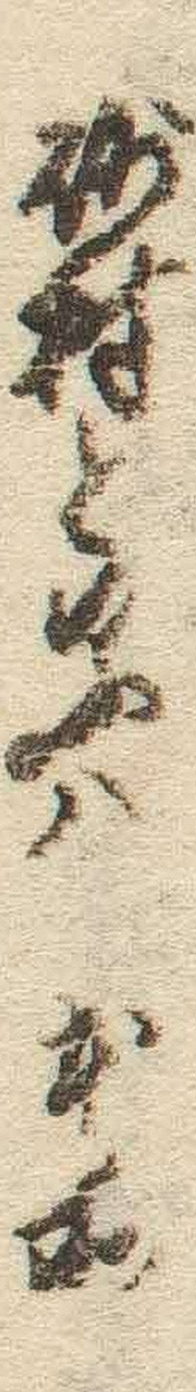砂村といふは本所
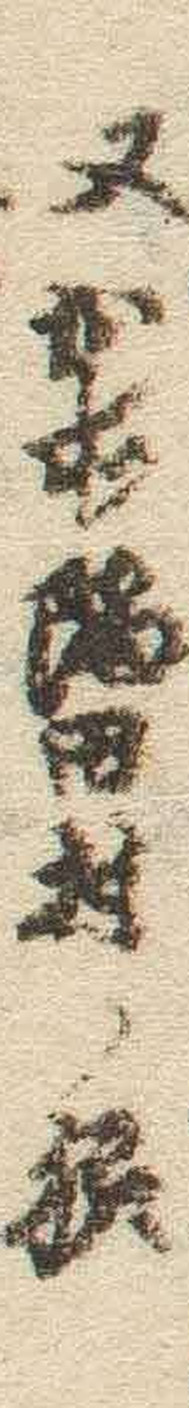又本所隅田村ノ脇
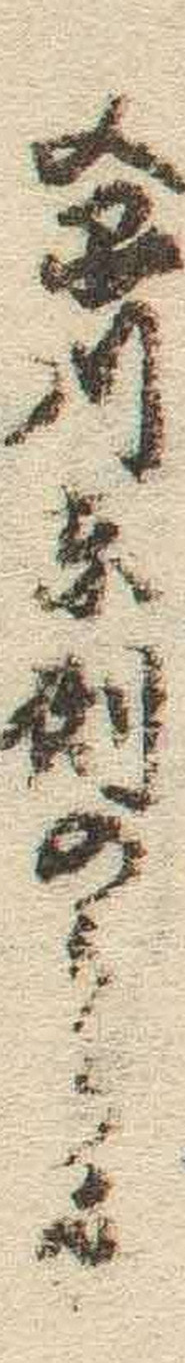又品川東側のうら手
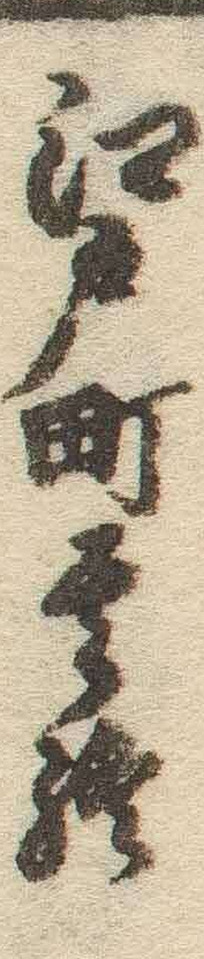江戸町尽終

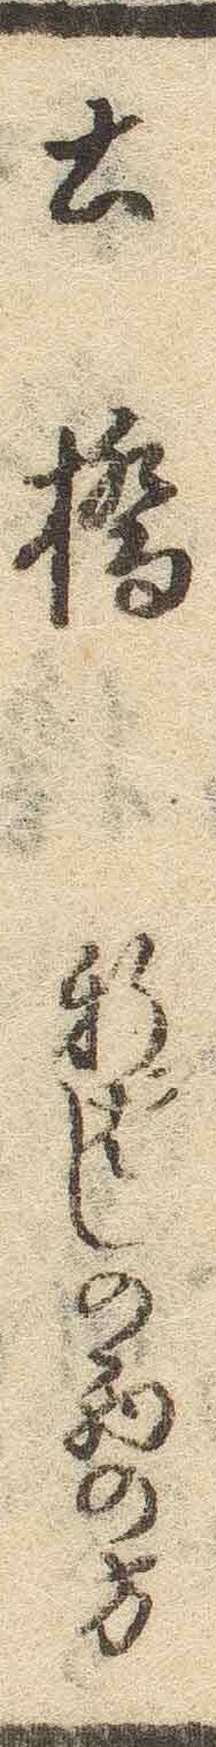土橋新ばしの西の方
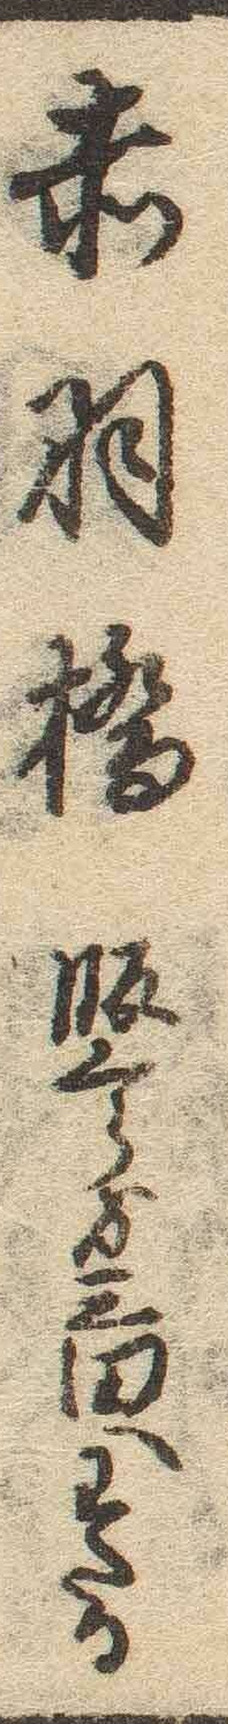赤羽橋飯くらゟ三田へわたる

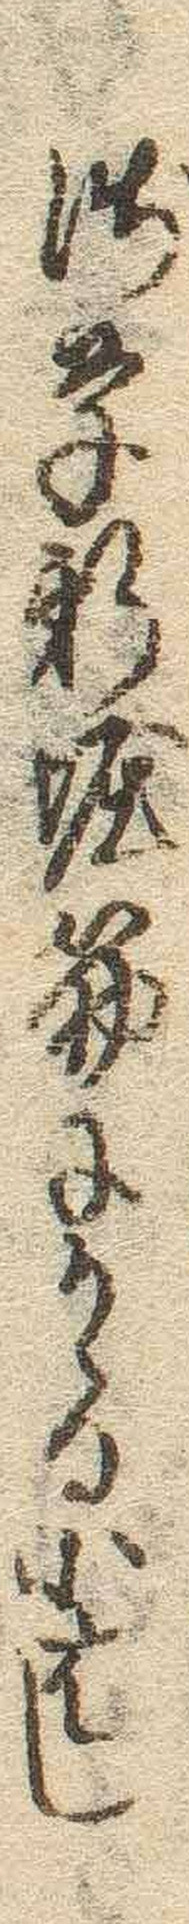浅草新堀筋にかゝる小はし

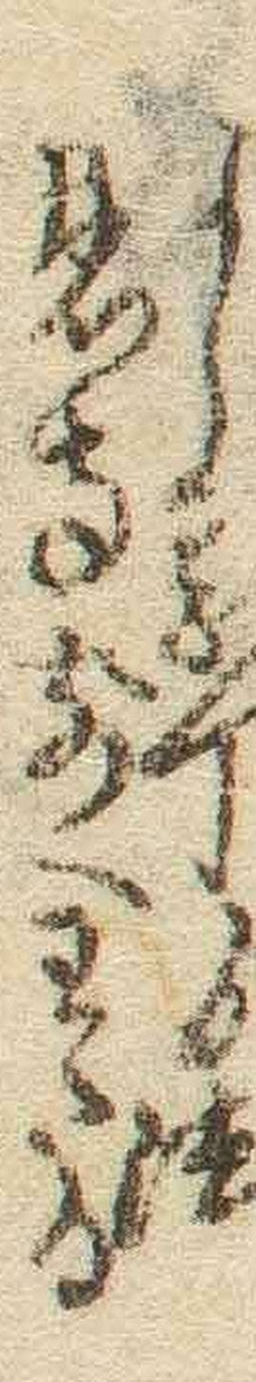恩寺前へわたる

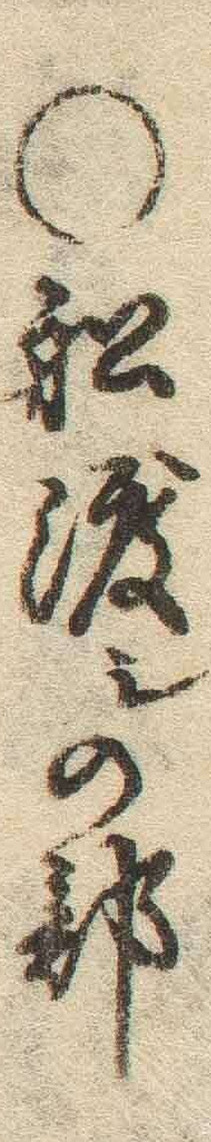○船渡シの部
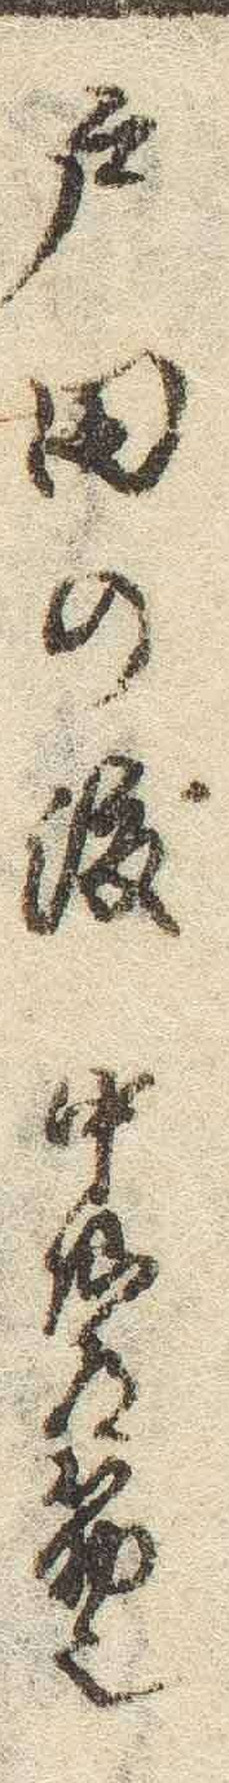戸田の渡中仙道筋也
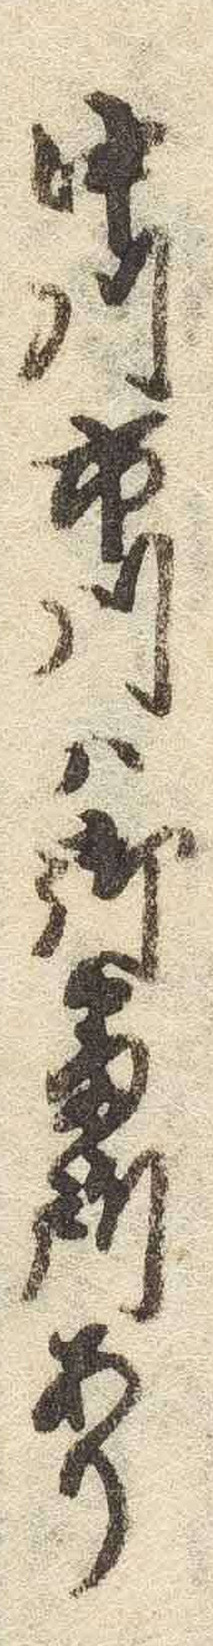中川市川は御番所あり
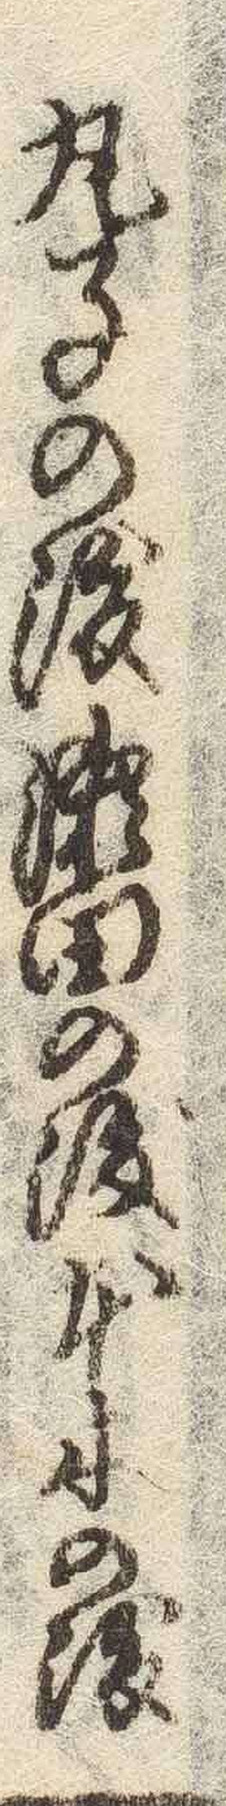丸子の渡瀬田の渡本木の渡
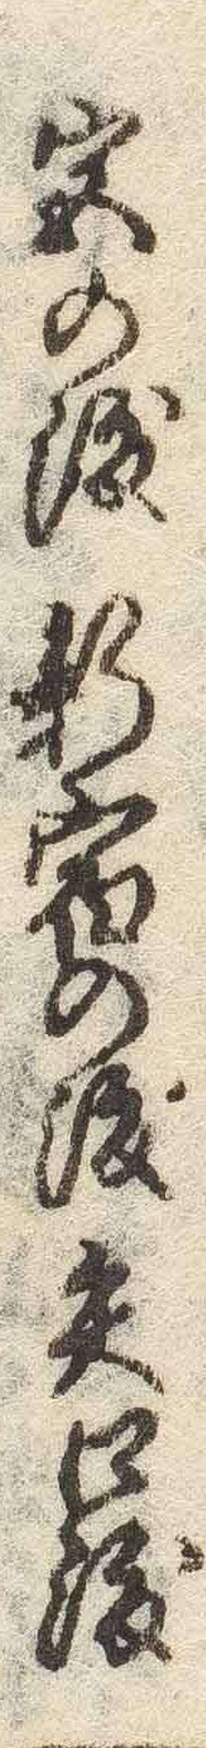宮の渡新宿の渡矢口渡
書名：江戸町独案内
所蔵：東京学芸大学附属図書館 国文学研究資料館
